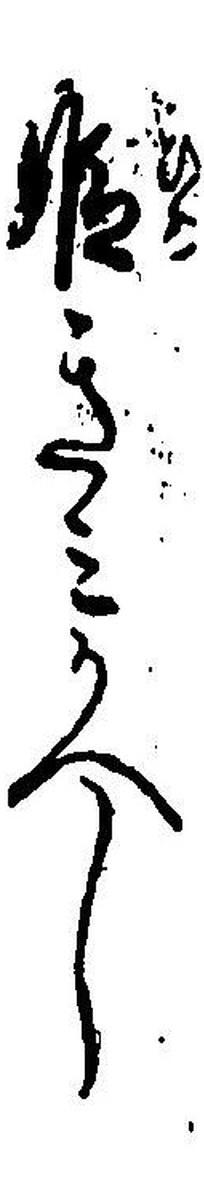姫きみかへし
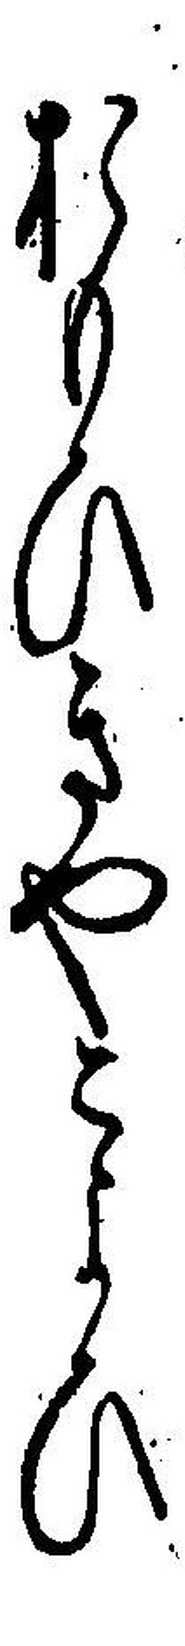おもひきやこよひ
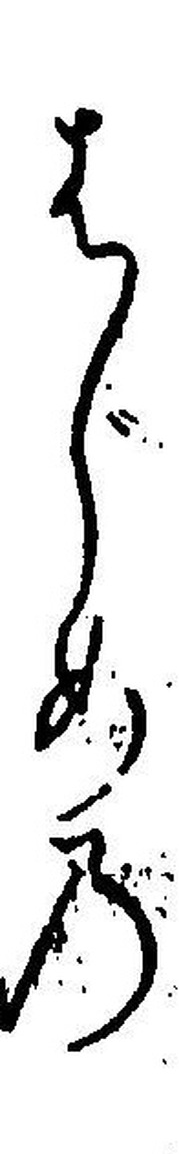はじめの
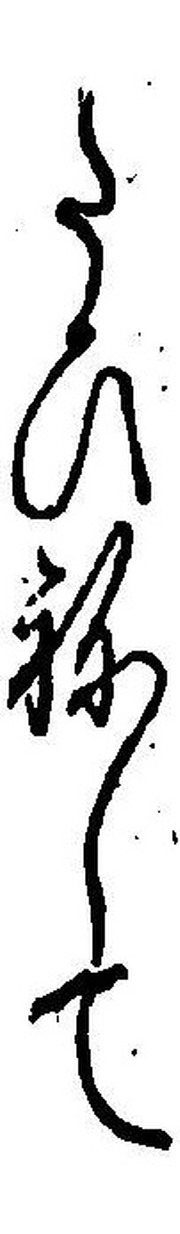たひねして
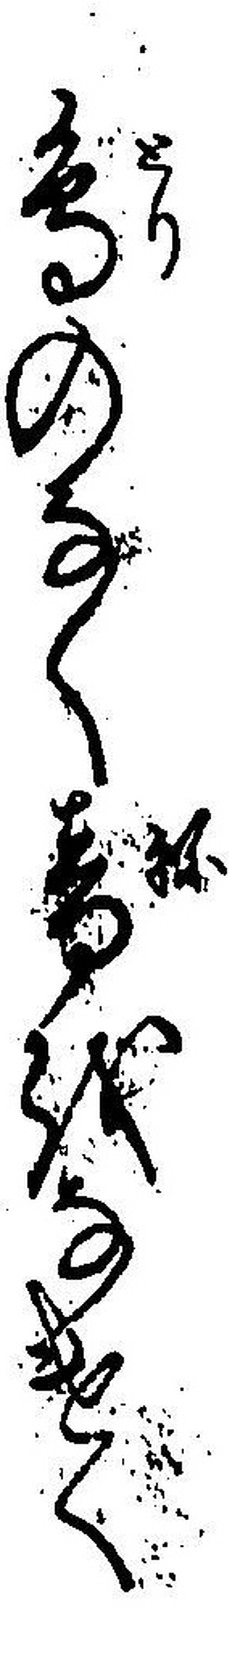鳥のなく音をなけく
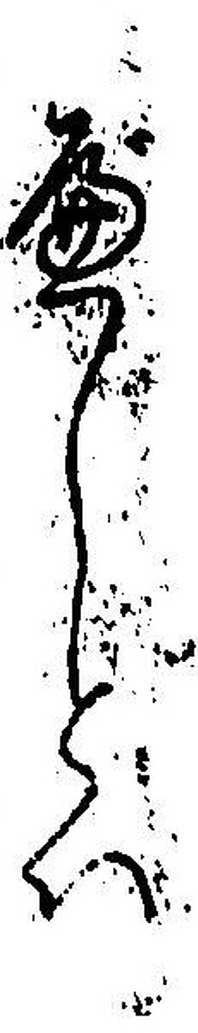べしとは

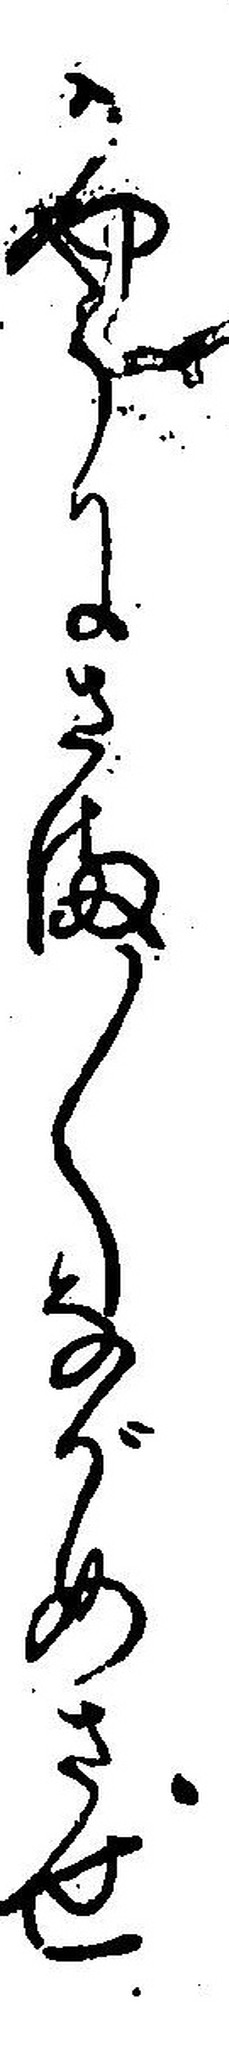かやうにさま〳〵ながめさせ
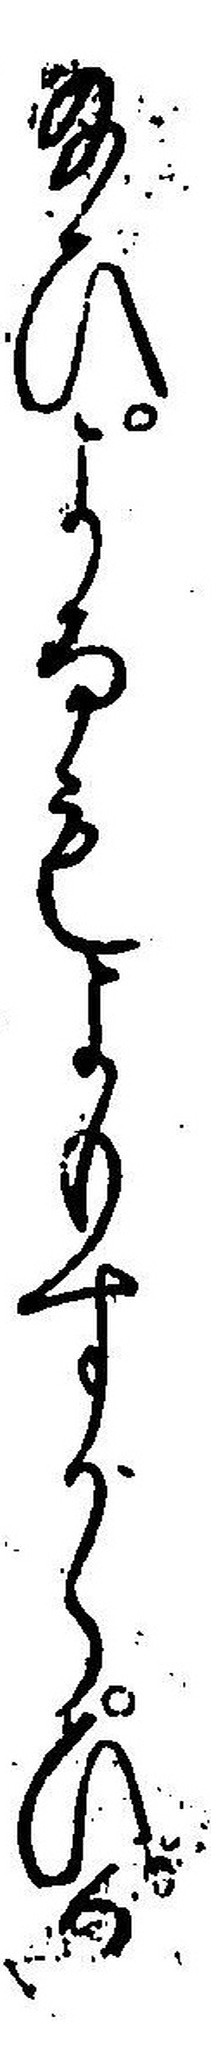給ひ。よるもよもすがら。ひる
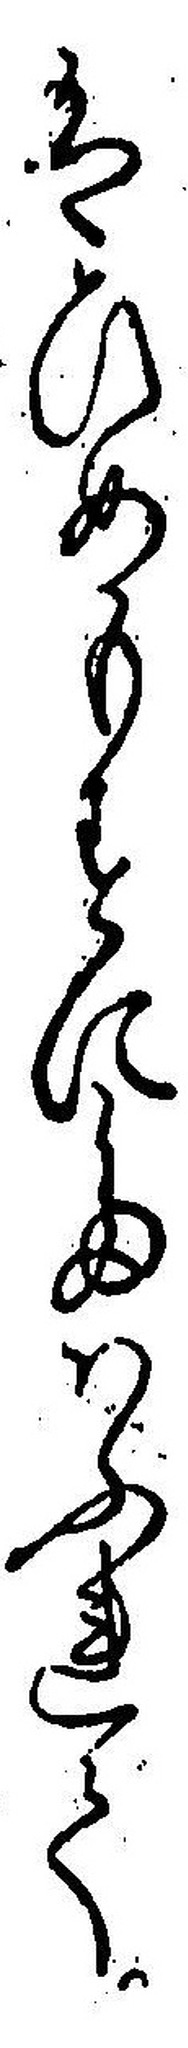はひめもすにたはふれて。
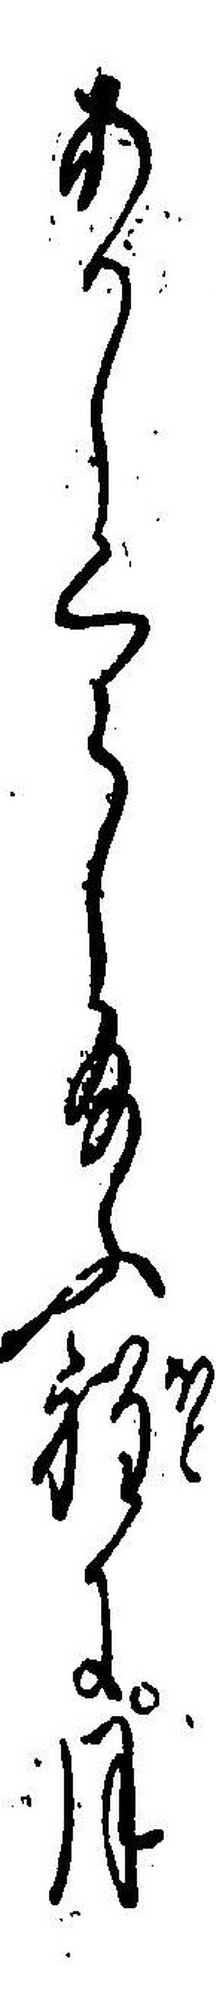あかしくらし給ふ程に。月
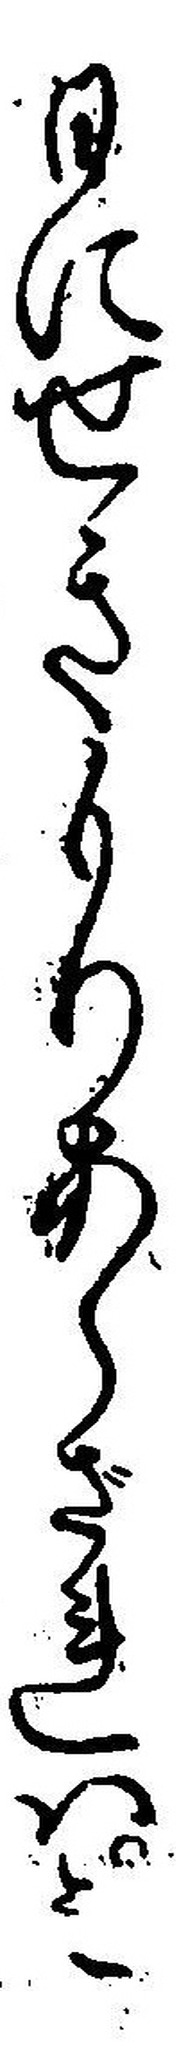日にせきもりあらざれは。み
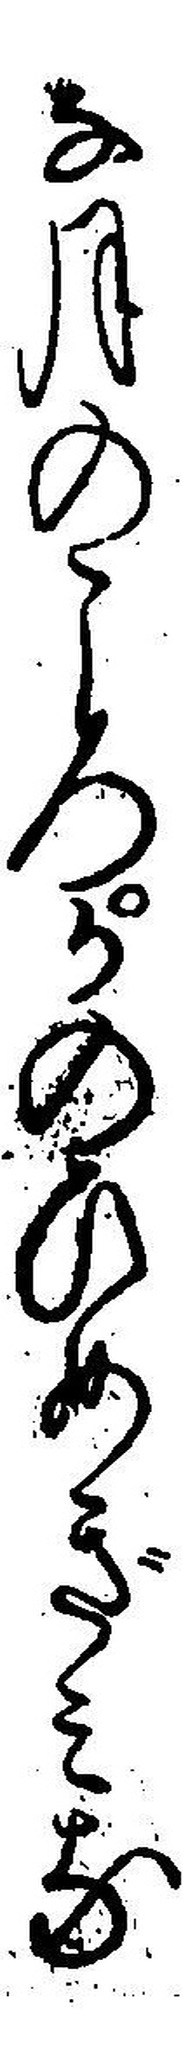な月のころ。かのひめぎみな
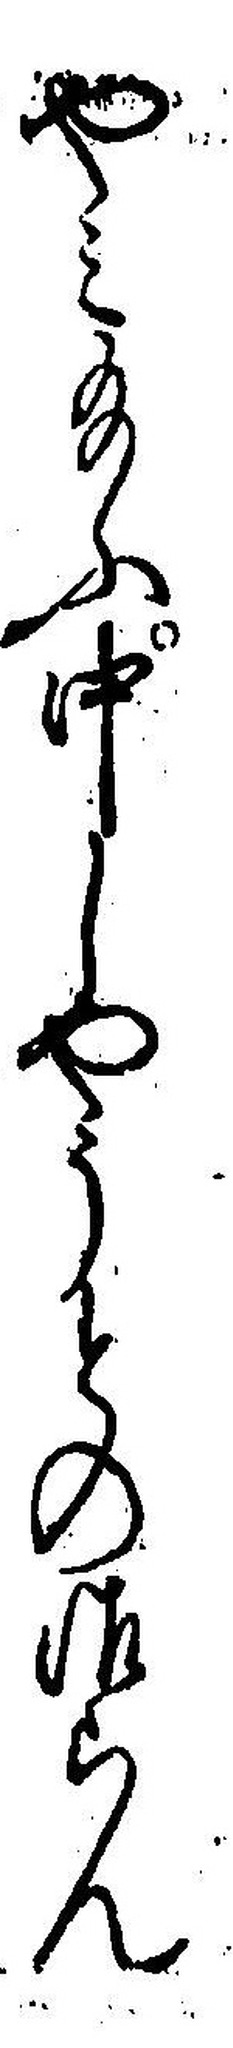やみ給ふ。中しやうとの御らん
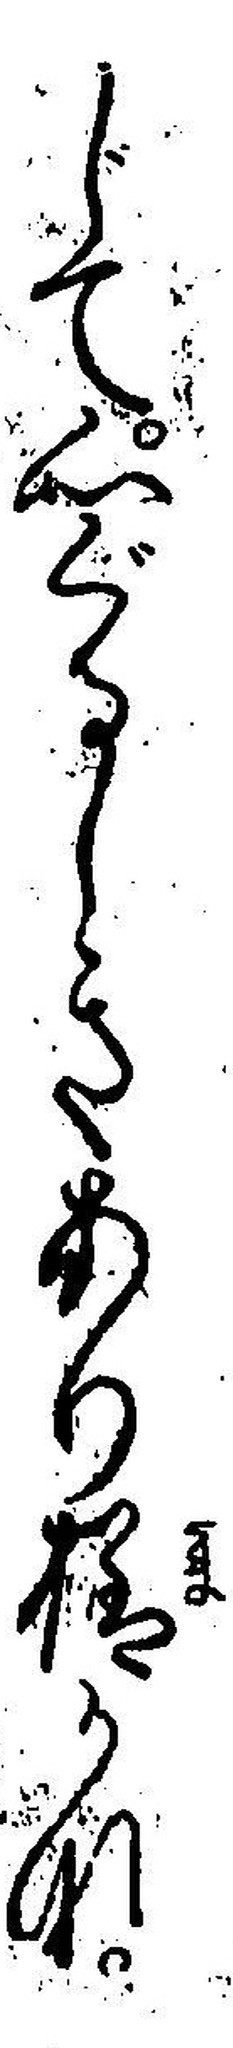じて。心ぐるしきあり様かな。
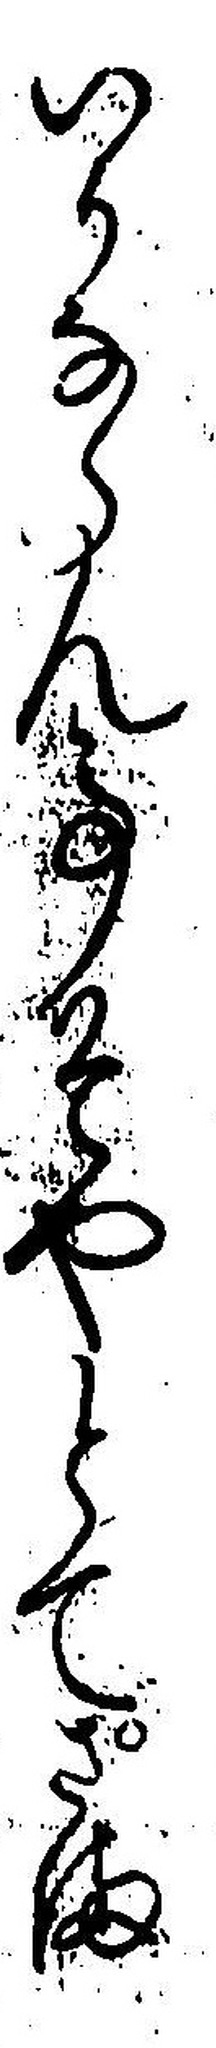いかならん事そやとて。さま
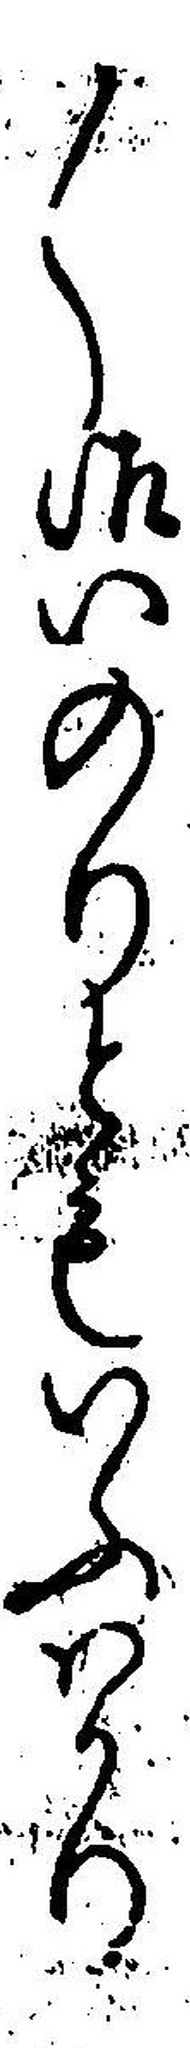〳〵御いのりともいふはかり
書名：木幡きつね
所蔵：東京大学総合図書館 General Library in the University of Tokyo, JAPAN
